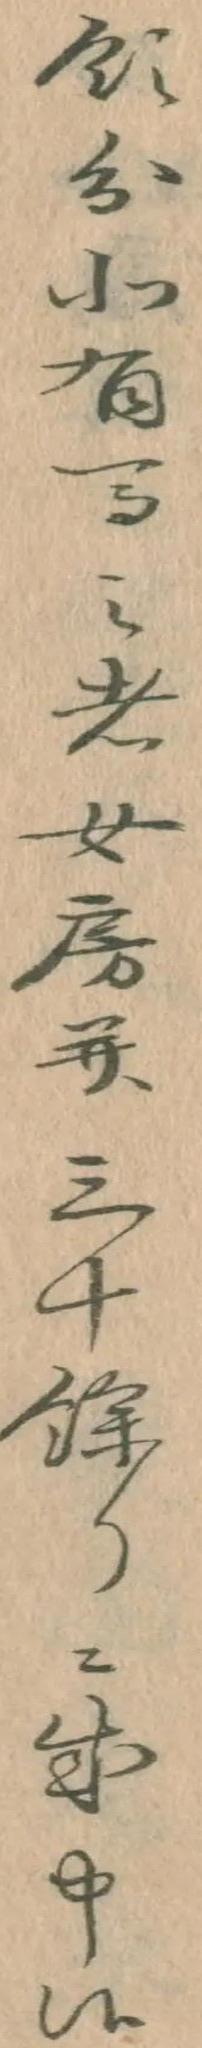領分北有馬之者女房幷三十余りに成申候
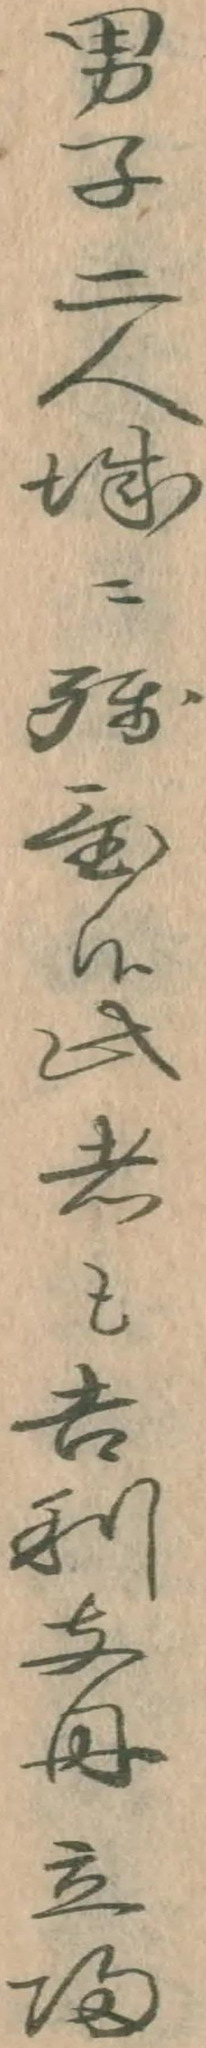男子二人城に残置候此者も吉利支丹立帰
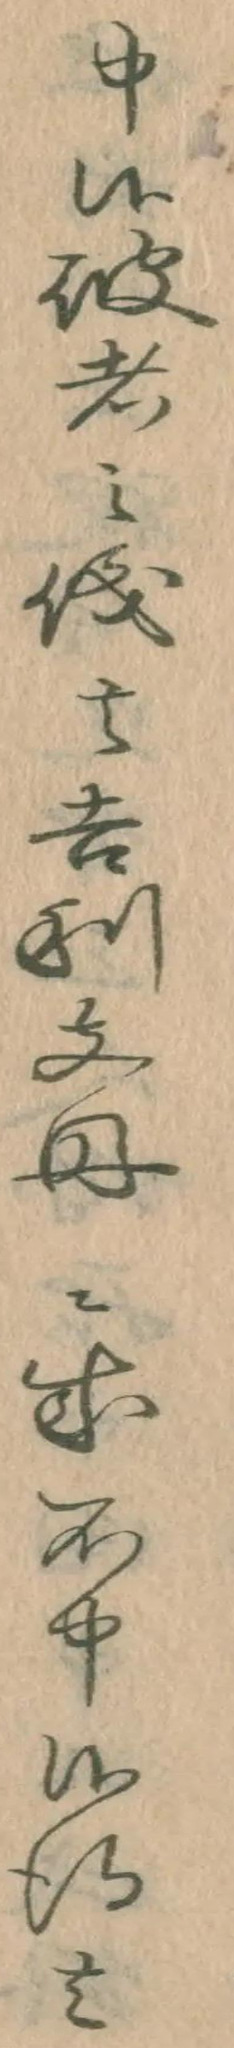申候彼者之儀者吉利支丹に成不申候得者
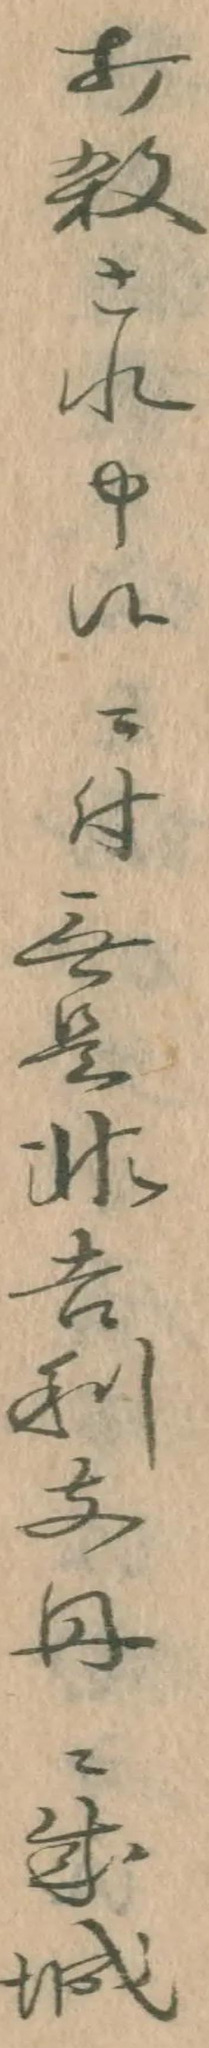打殺され申候に付無是非吉利支丹に成城
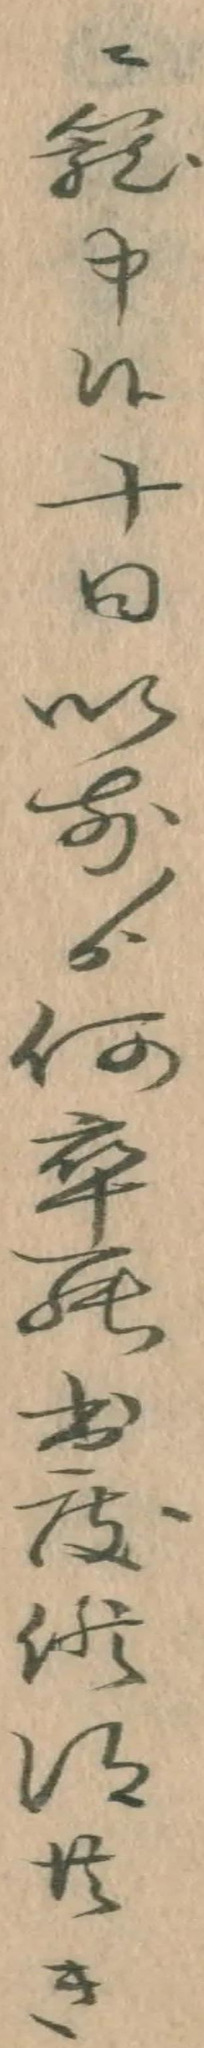に籠申候十日以前ゟ何卒罷出度候得共き
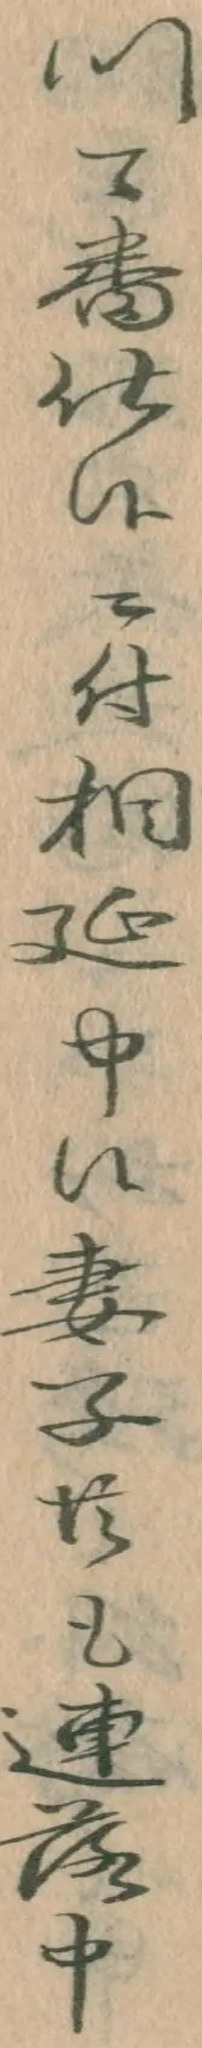川て番仕候に付相延申候妻子共も連落申
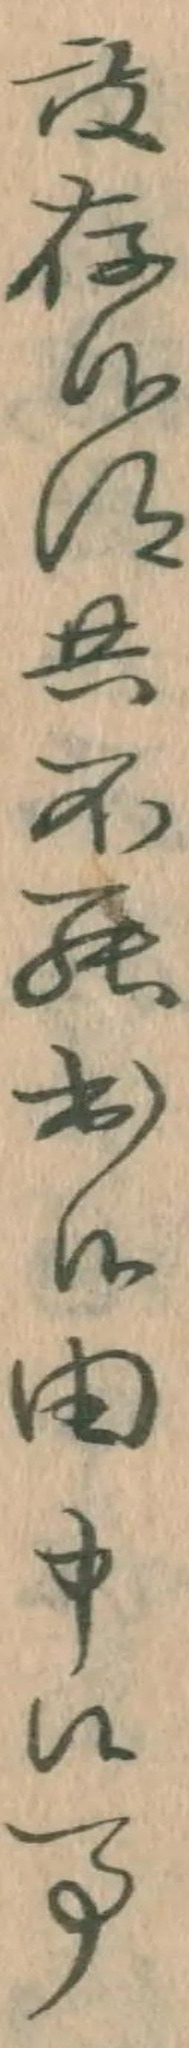度存候得共不罷出候由申候事
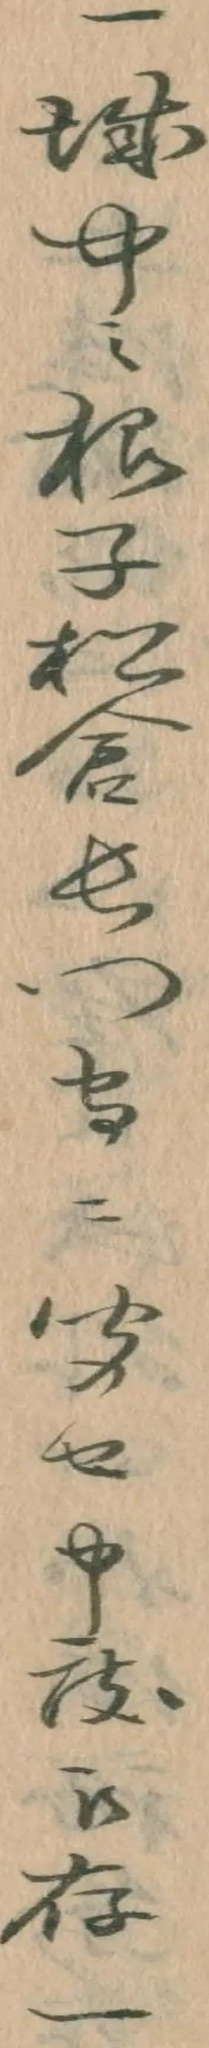一城中之様子松倉長門守に聞せ申度被存一
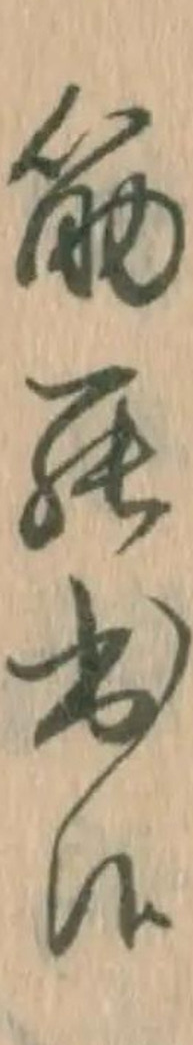筋罷出候
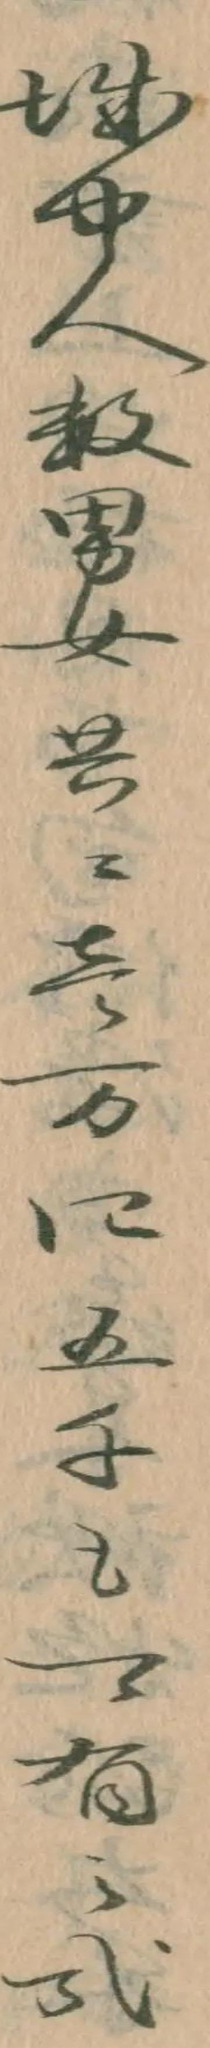一城中人数男女共に壱万四五千も可有之哉
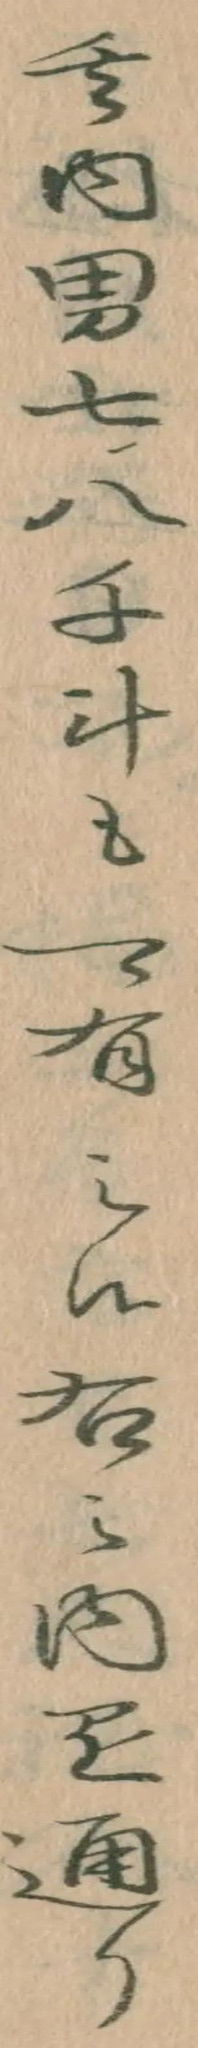其内男七八千斗も可有之候右之内懸通り
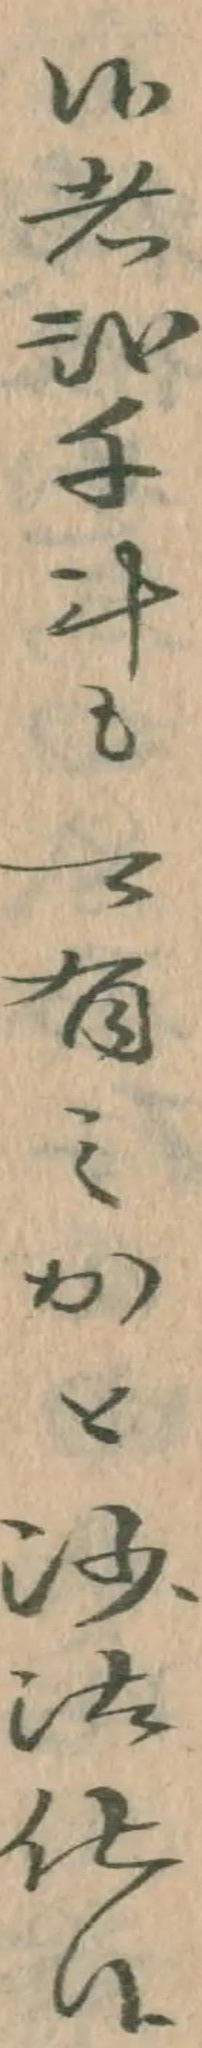候者弐千斗も可有之かと沙汰仕候
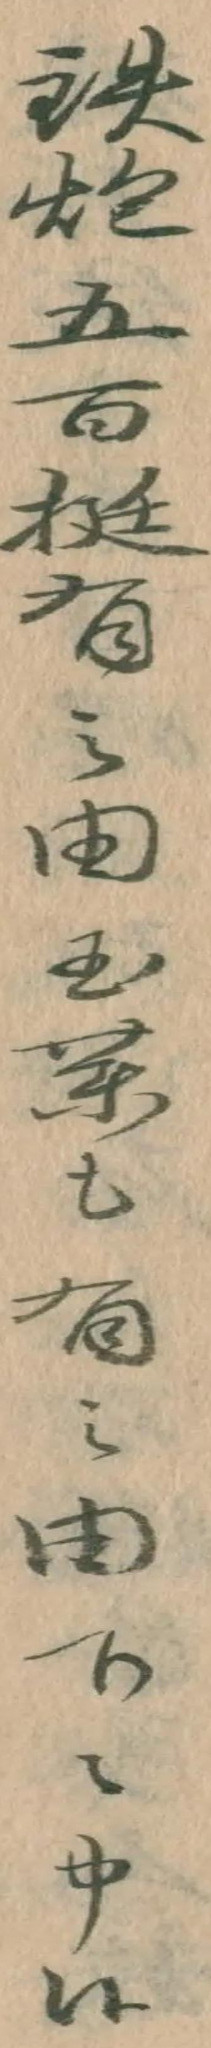一鉄炮五百挺有之由玉薬も有之由下々申候
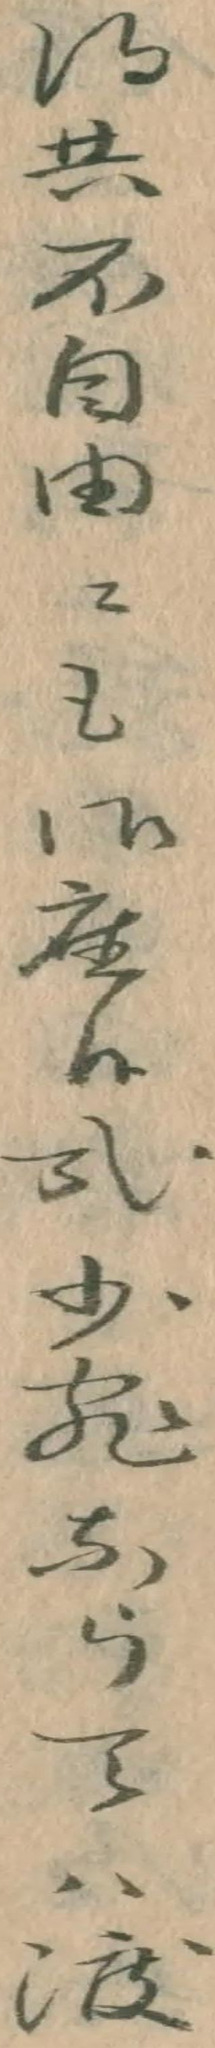得共不自由にも御座候哉少究ならては渡
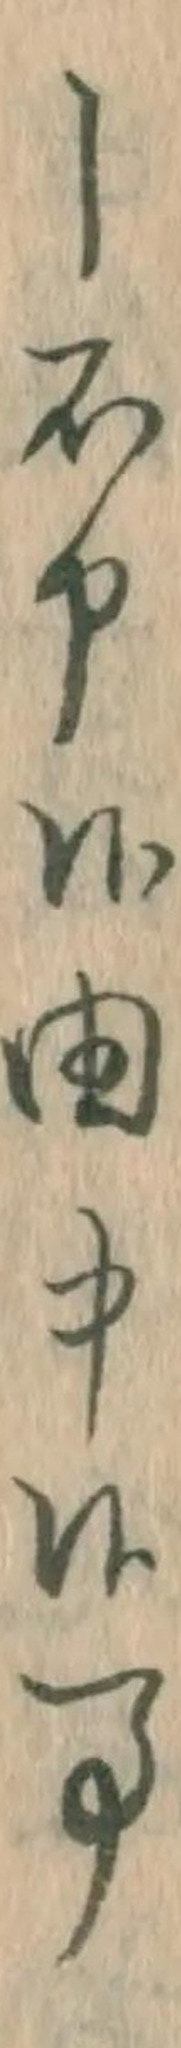し不申候由申候事
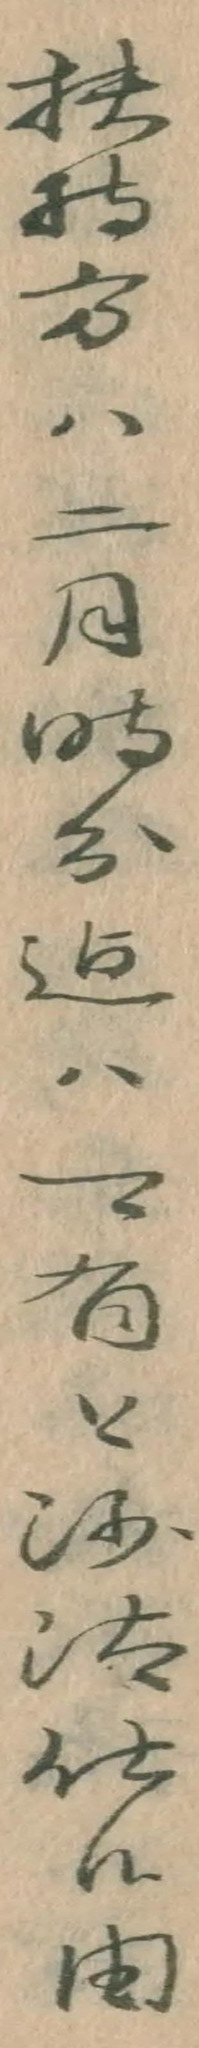一扶持方は二月自分迄は可有と沙汰仕候由
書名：切支丹御退治記 49巻. [4]
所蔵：国立国会図書館 National Diet Library, JAPAN
